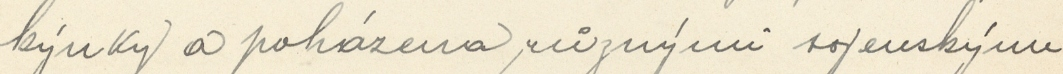kýnky a poházena různými vojenskými
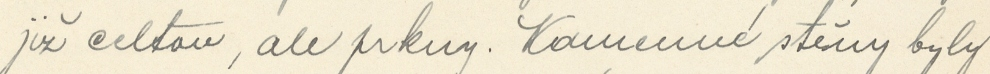již celtou, ale prkny. Kamenné stěny byly
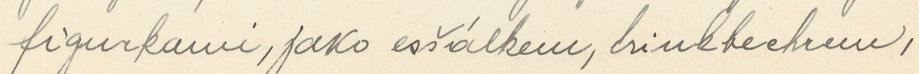figurkami, jako esšálkem, trinkbechrem,
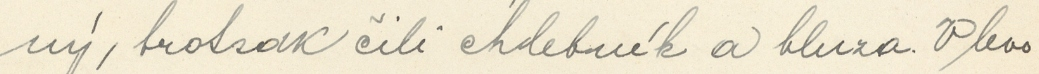ný, brotsak čili chlebník a bluza. V levo
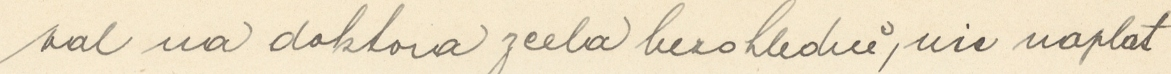val na doktora zcela bezohledně, nic naplat
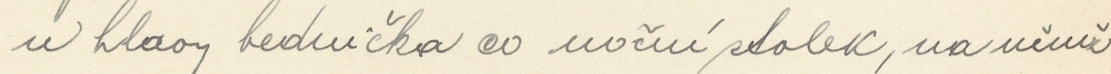u hlavy bednička co noční stolek, na němž
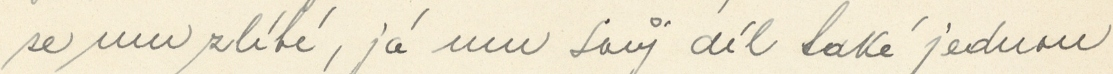se mu zlíbí, já mu svůj díl také jednou
